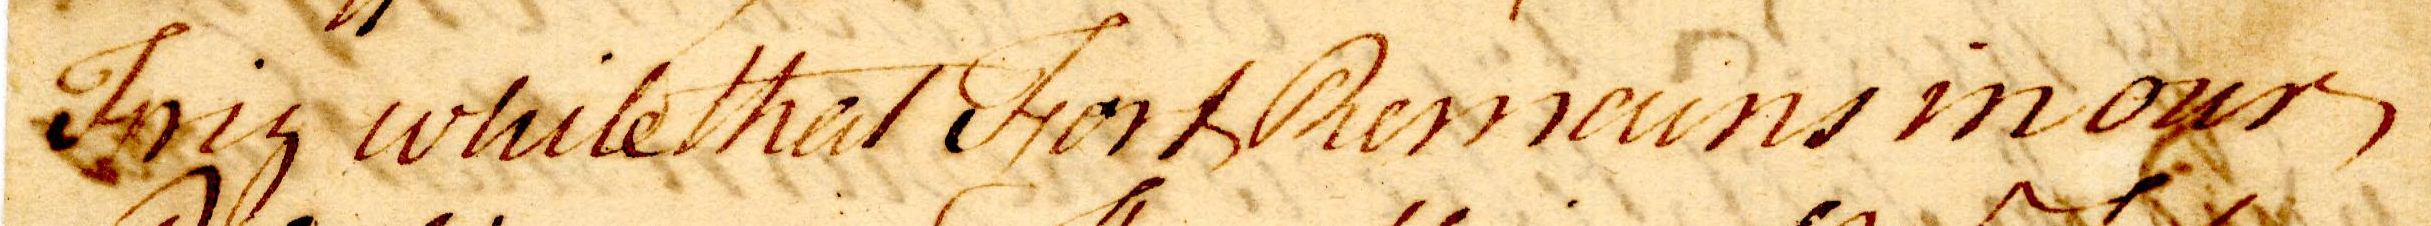Friz while that Fort Remains in our
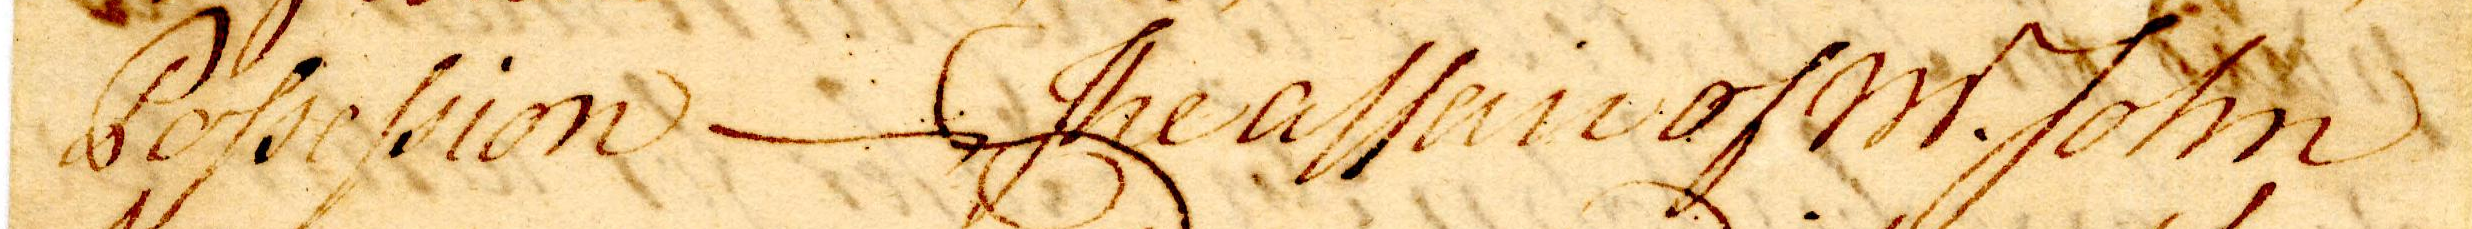Possession- The affair of M^r. John
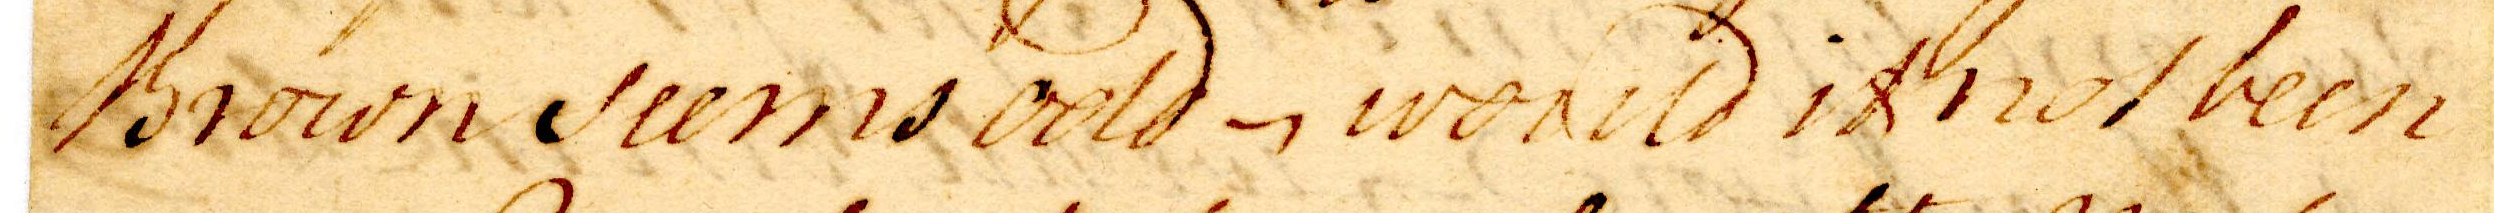Brown seems cold- would it not been
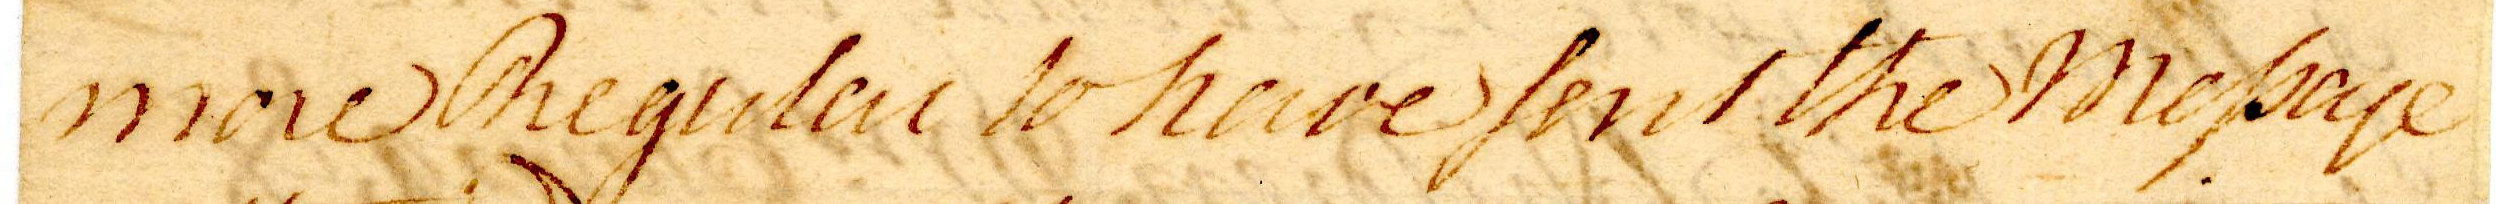more Regular to have sent the Message
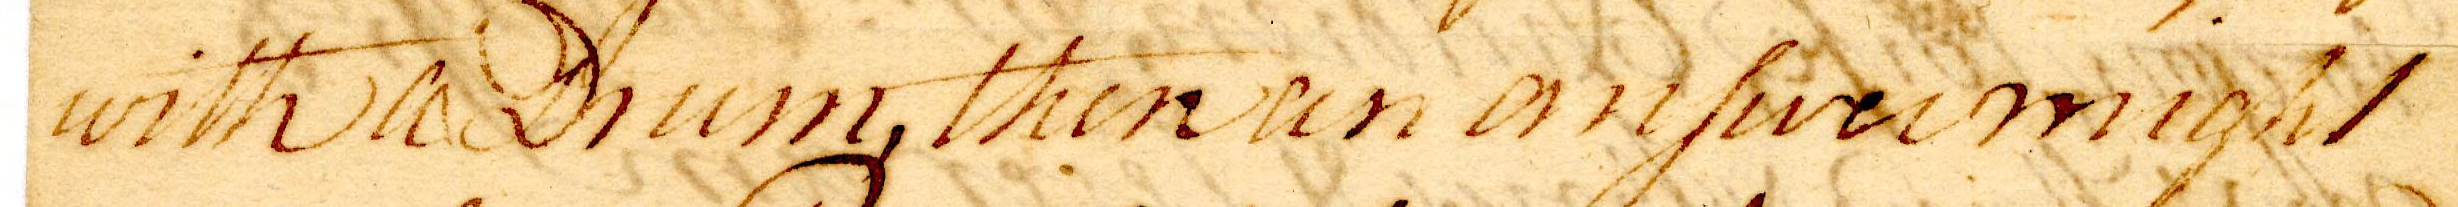with a Drum, then an answer might
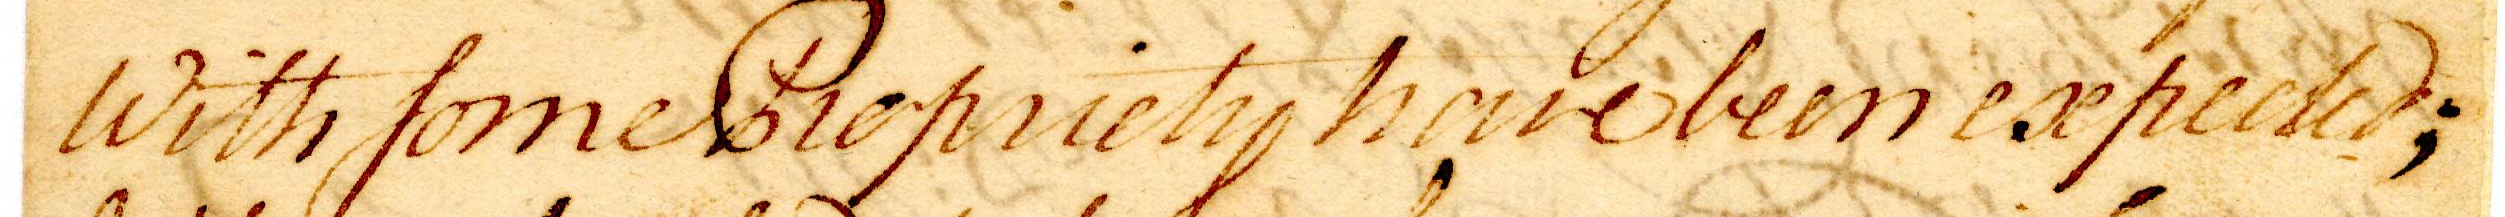With some Propriety have been expected;
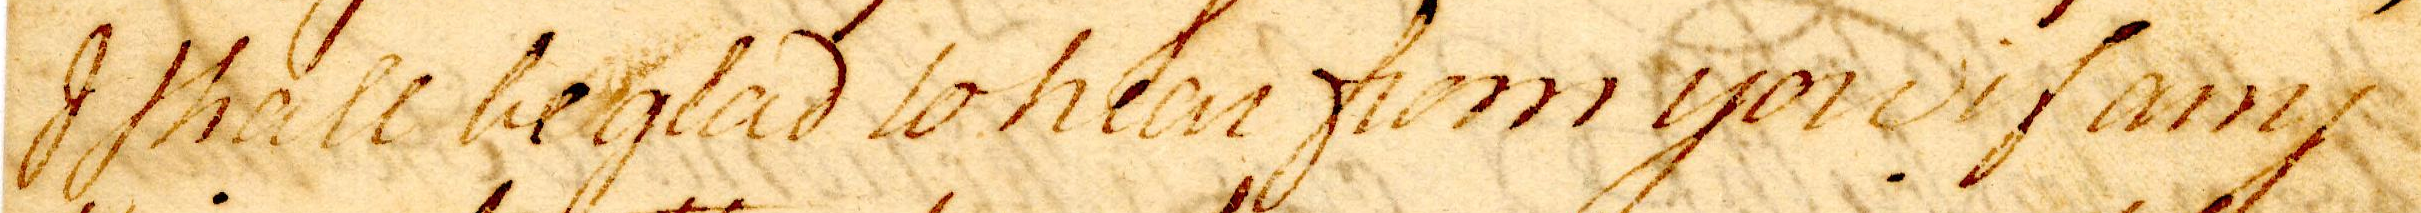I shall be glad to hear from you if any
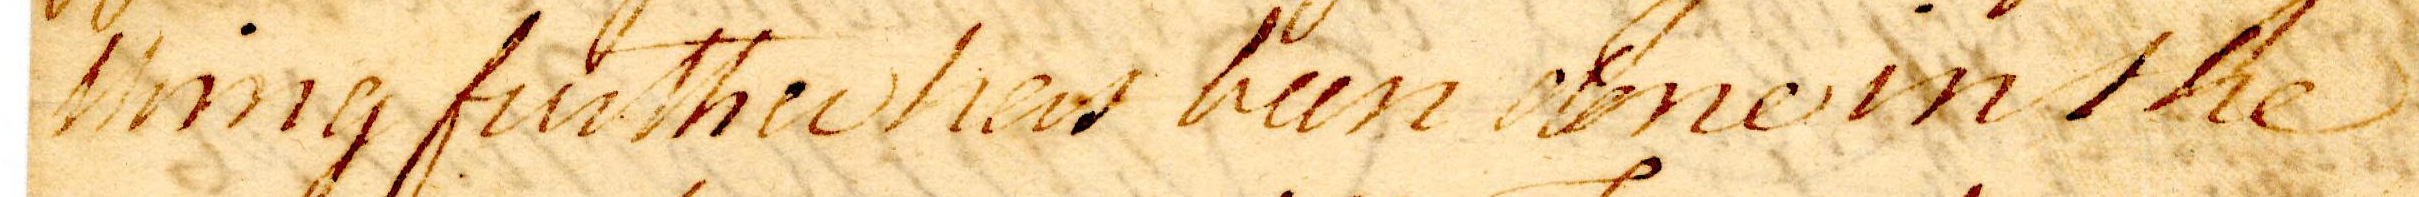thing further has been done in the
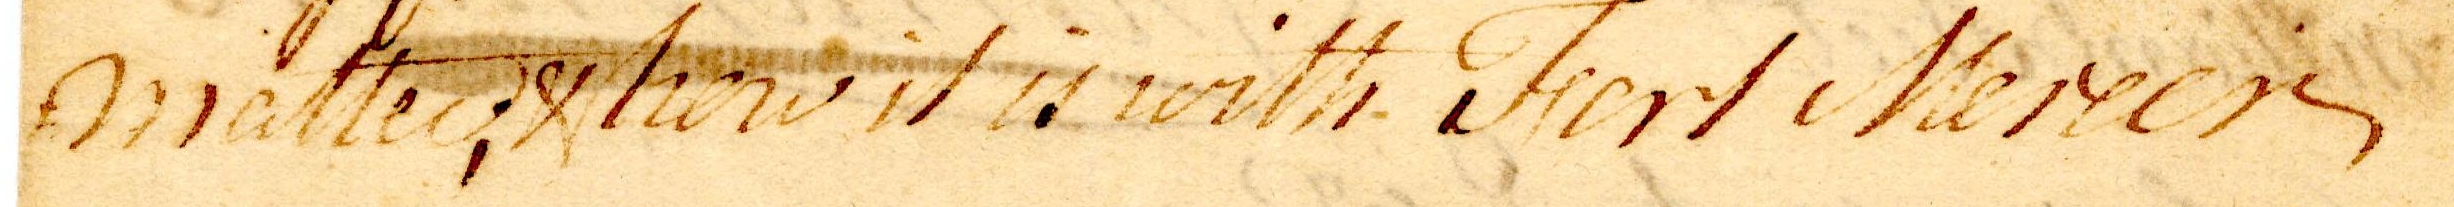Matter; & here it is with Fort Mercer
